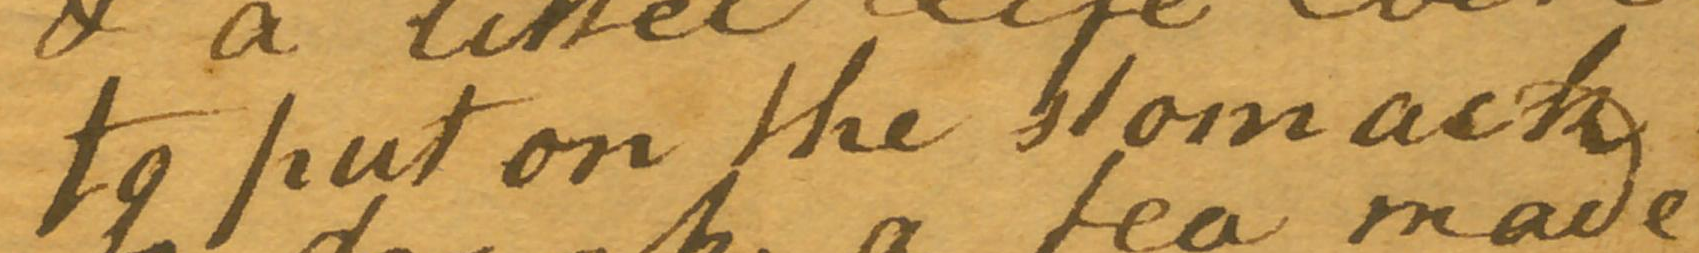to put on the stomack
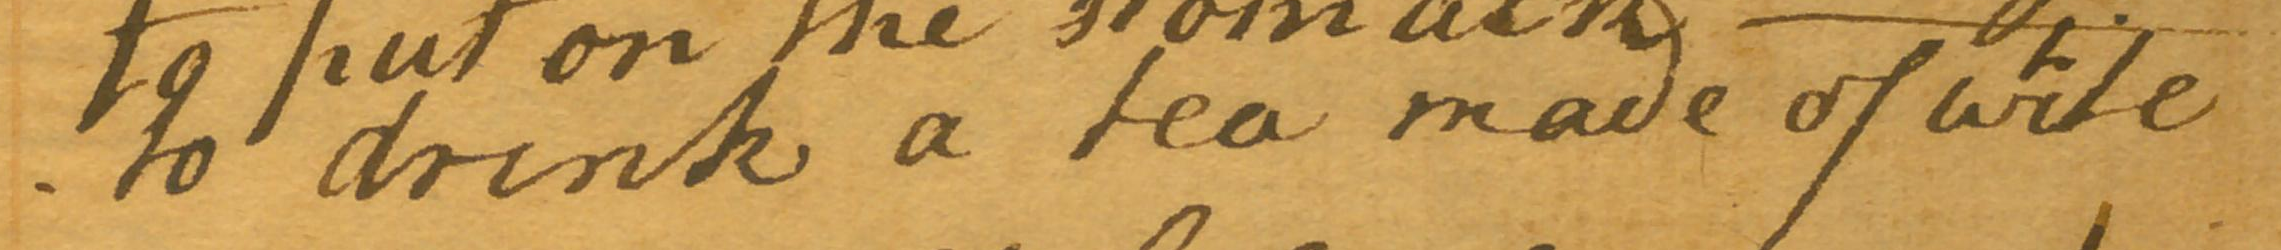to drink a tea made of wite
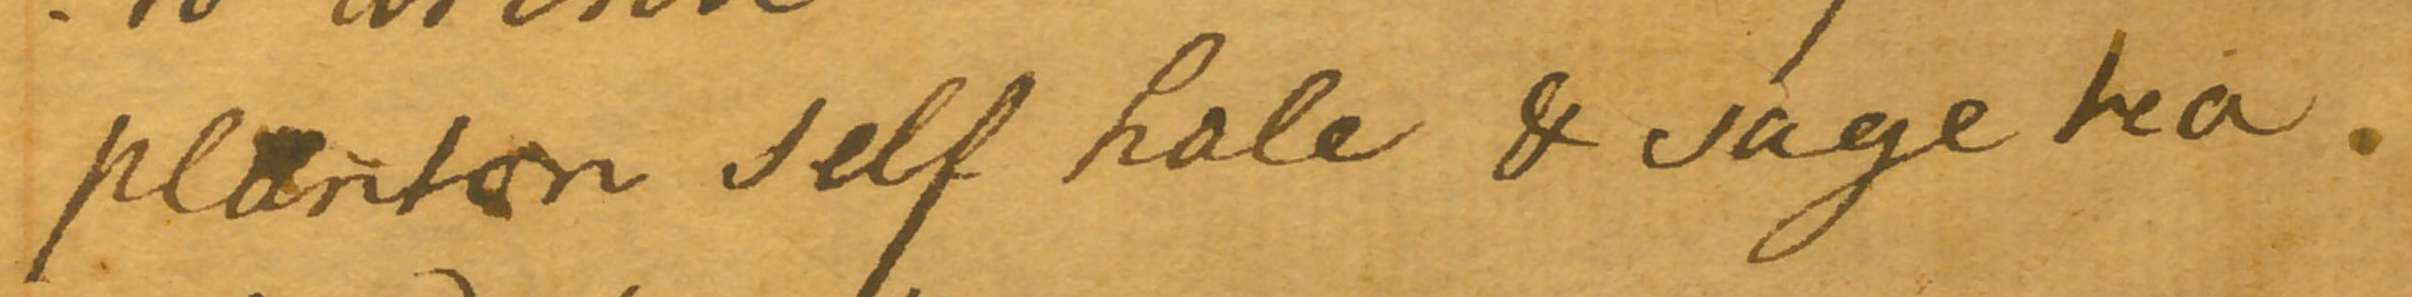planton self hale & sage tea
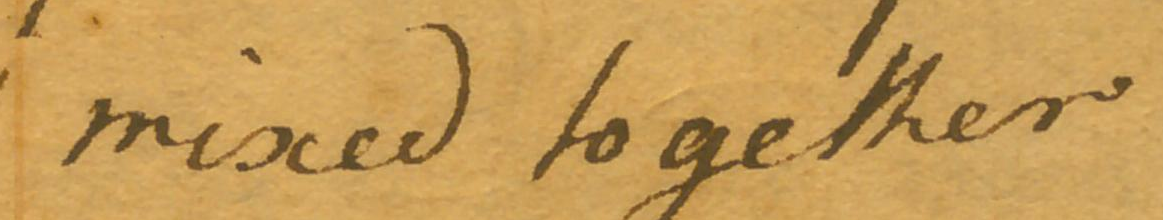mixed together
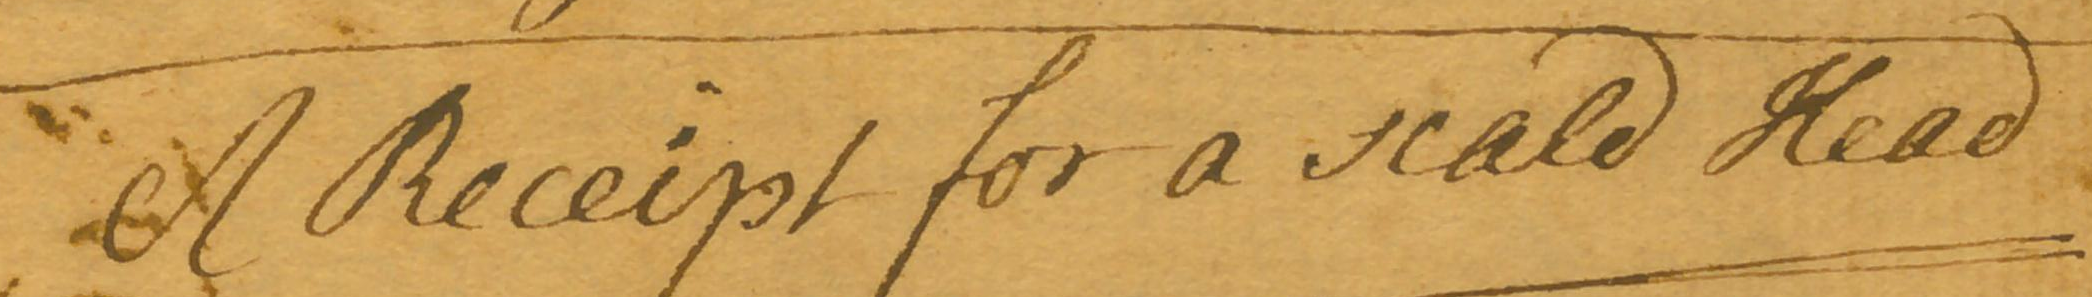A Receipt for a scald Head
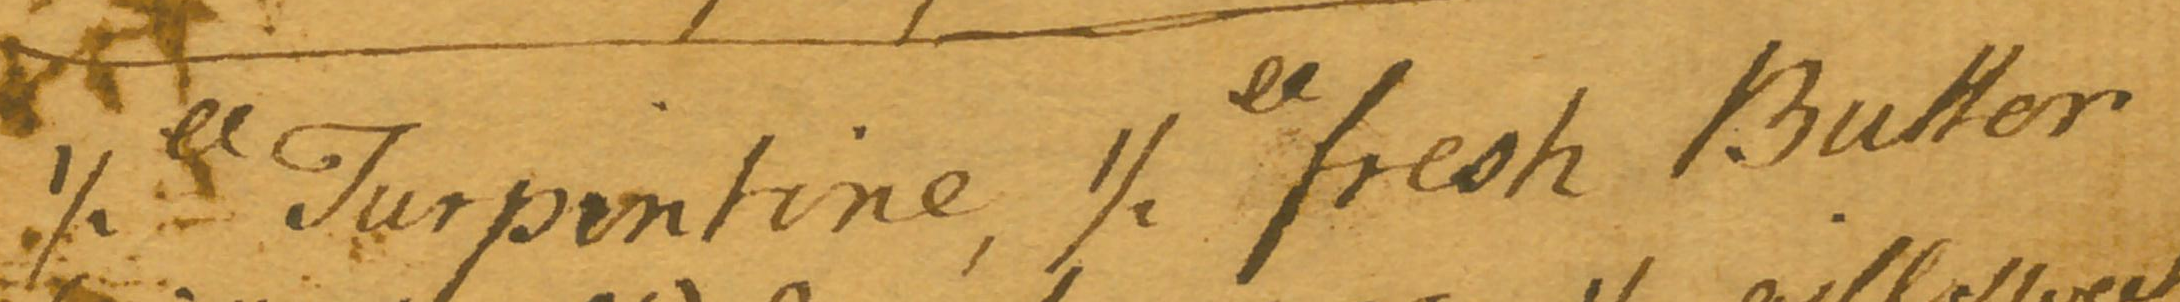1/2 ^lb Tupentine 1/2 ^lb fresh Butter
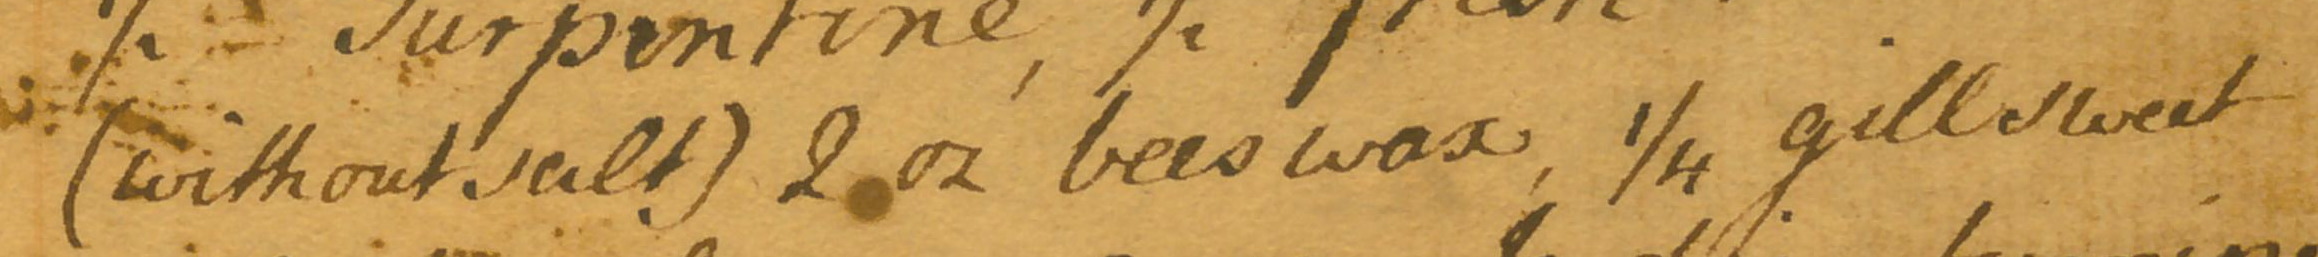(without salt) 2 oz beeswax, 1/4 gillsweet
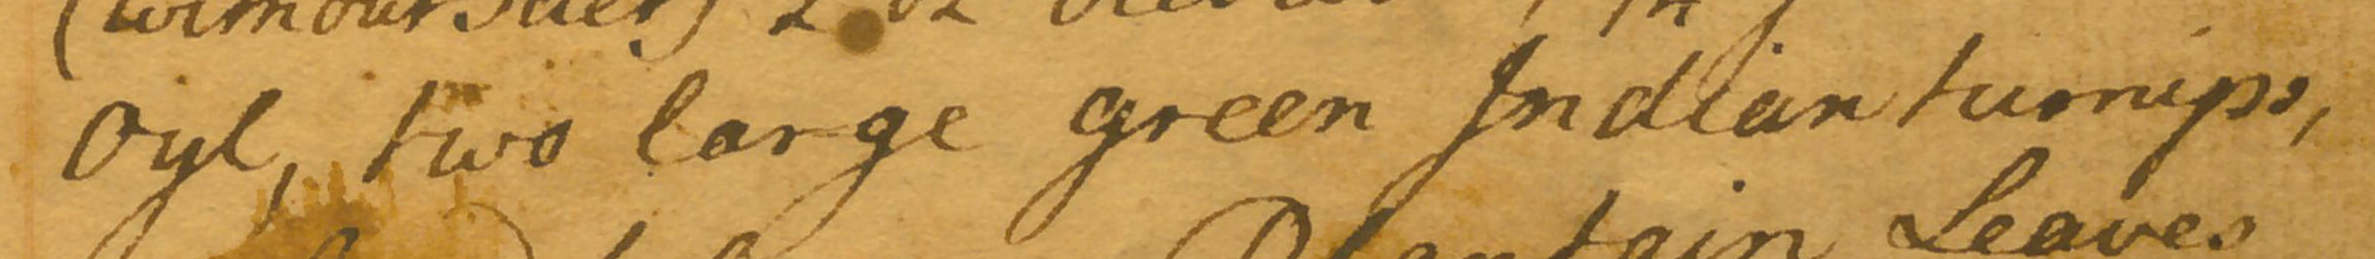Oyl, two large green Indian turnips,
